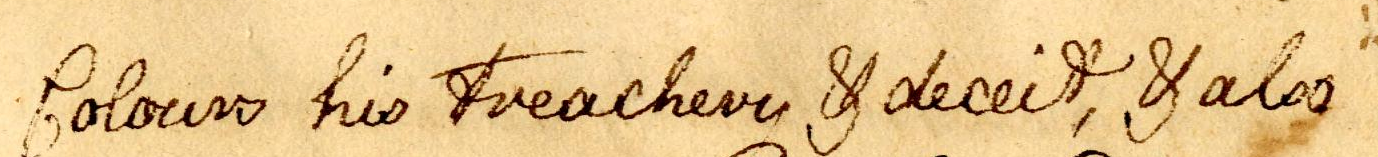Colours his treachery & deceit, & also
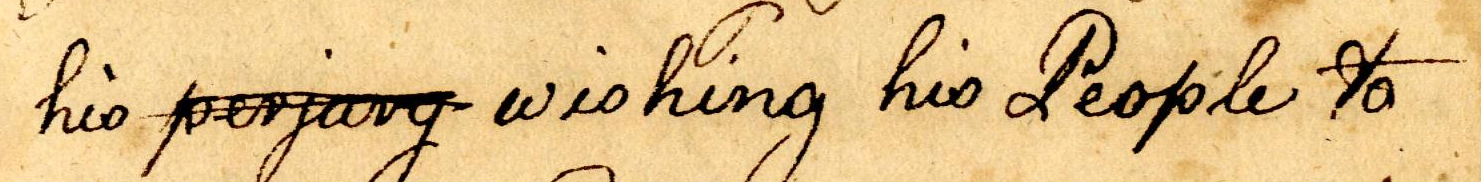his [perjury] wishing his People to
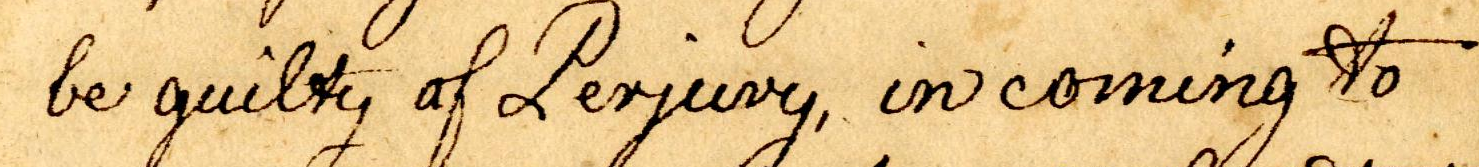be guilty of Perjury, in coming to
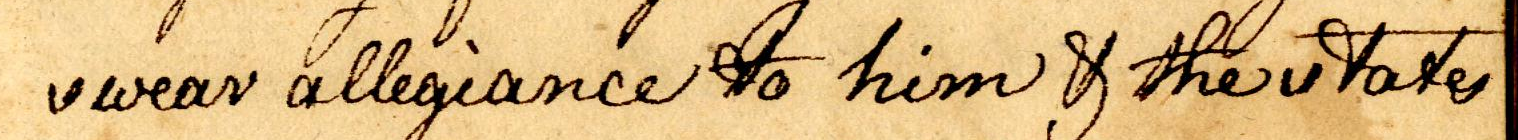swear allegiance to him & the states
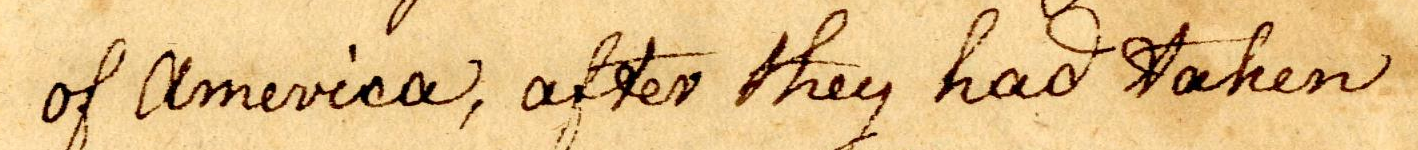of America, after they had taken
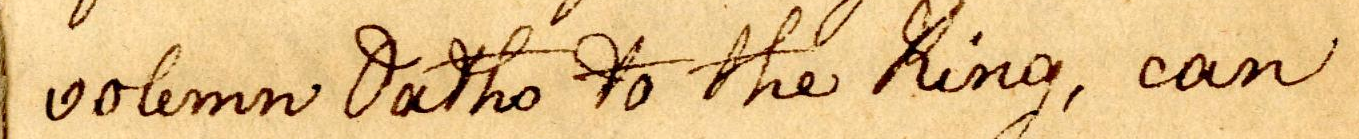solemn Oaths to the King, can
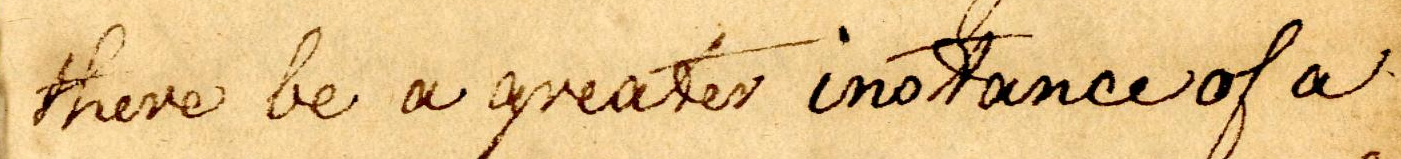there be a greater instance of a
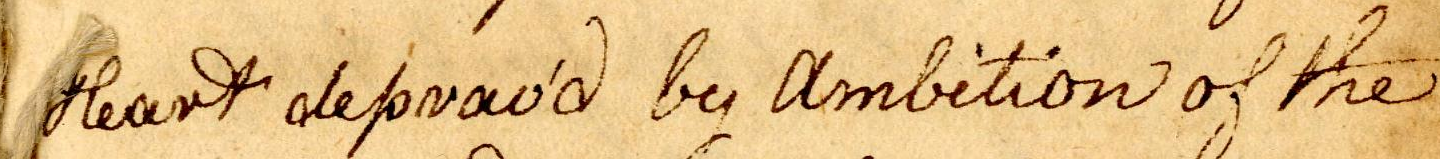Heart deprav'd by Ambition of the
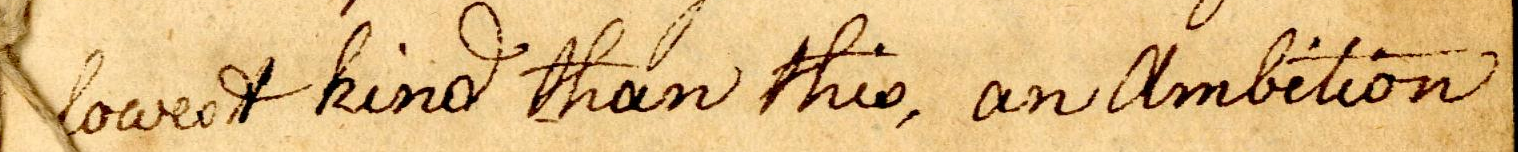lowest kind than this, an Ambition
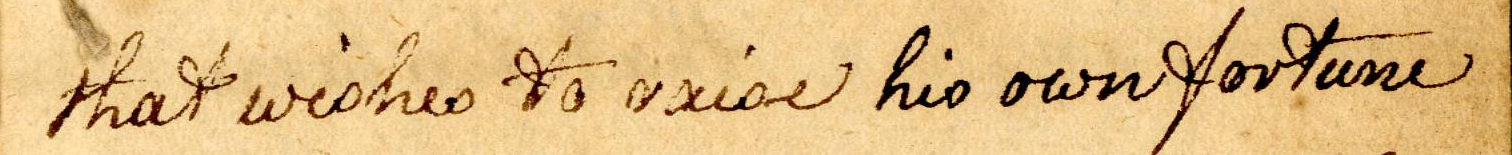that wishes to raise his own fortune
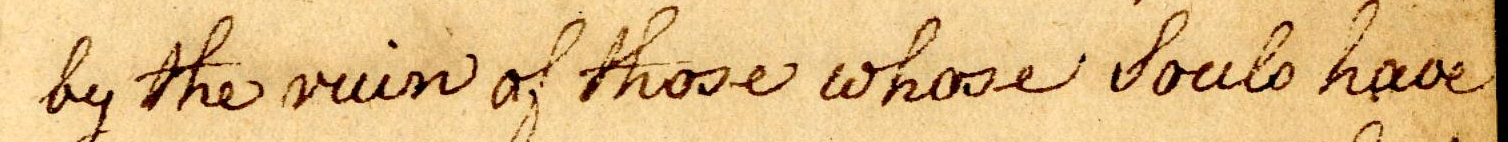by the ruin of those whose Souls have
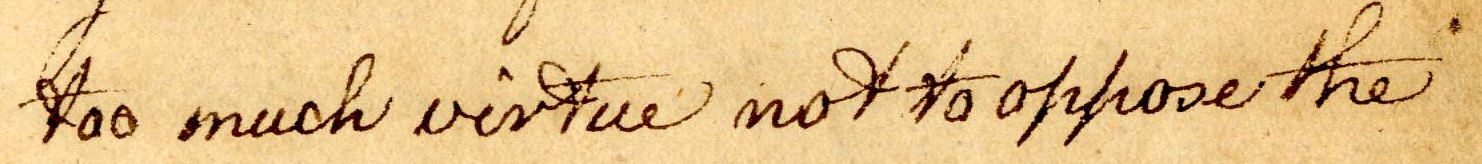too much virtue not to oppose the
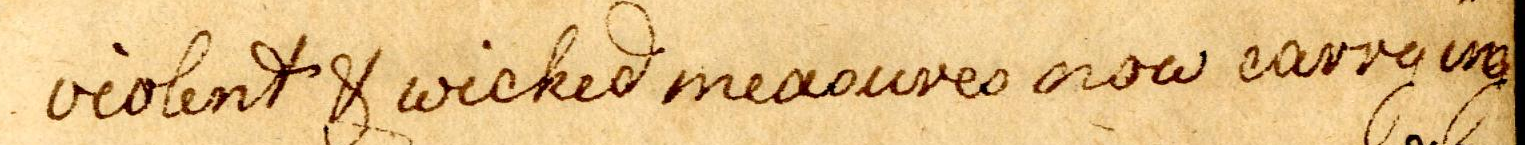violent & wicked measures now carrying
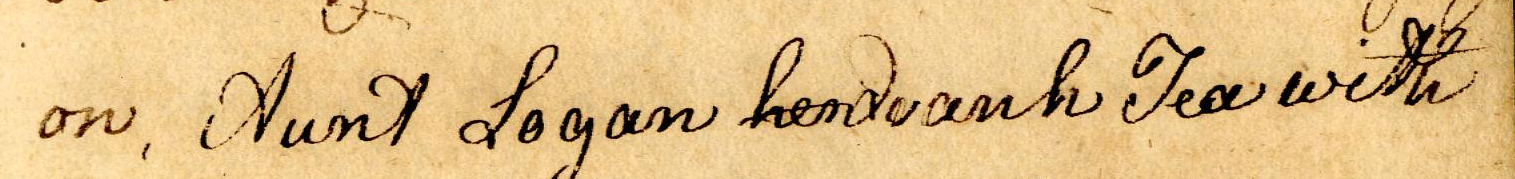on, Aunt Logan [her] drank Tea with
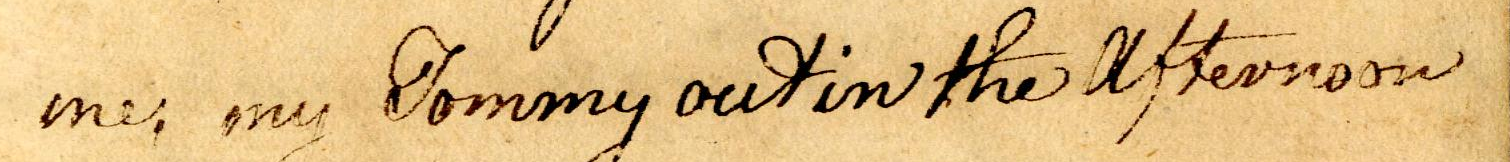me, my Tommy out in the Afternoon
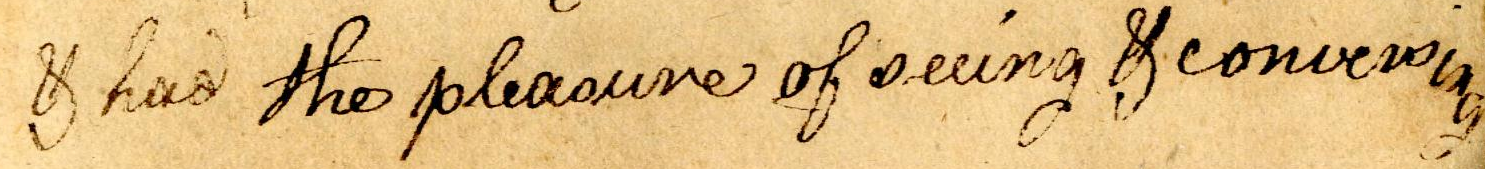& has the pleasure of seeing & conversing
